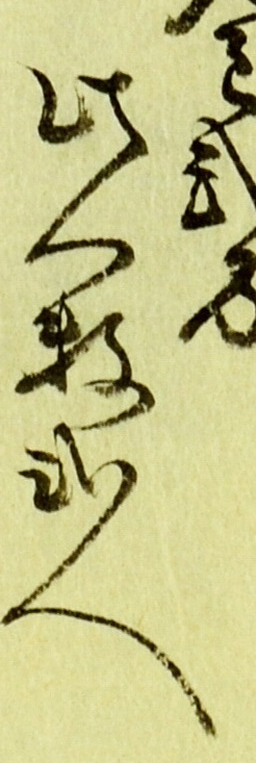此人数弐人
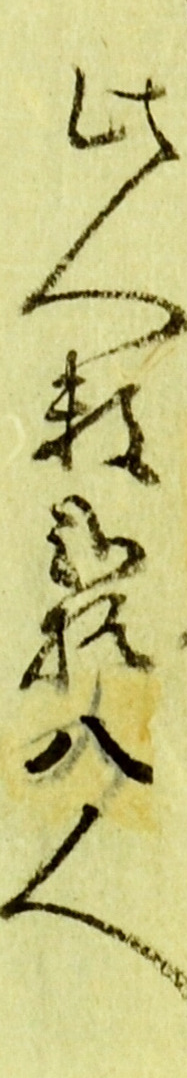此人数弐拾八人

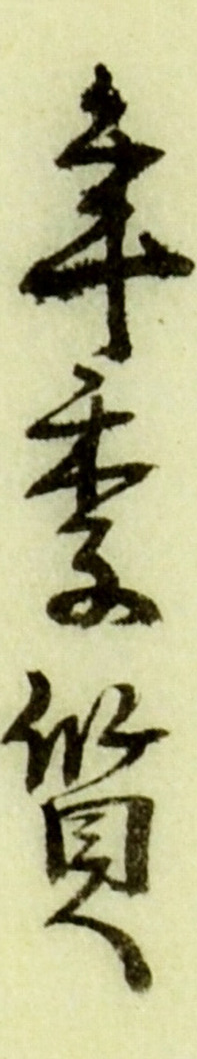年季質
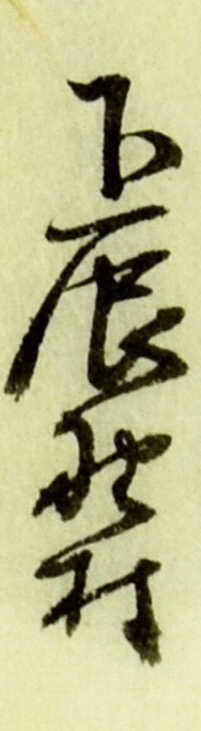下辰野村
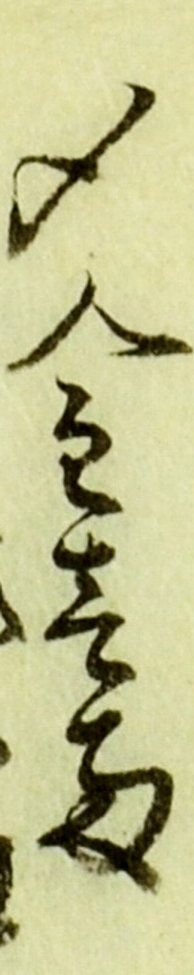〆金壱両
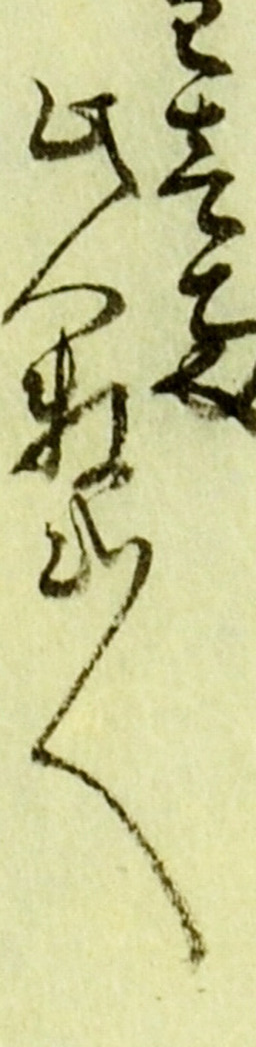此人数弐人
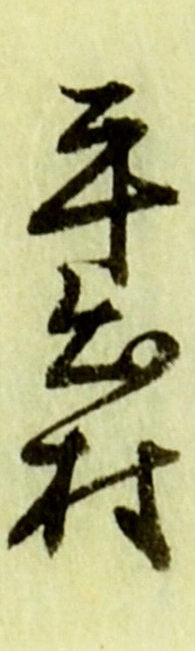平出村
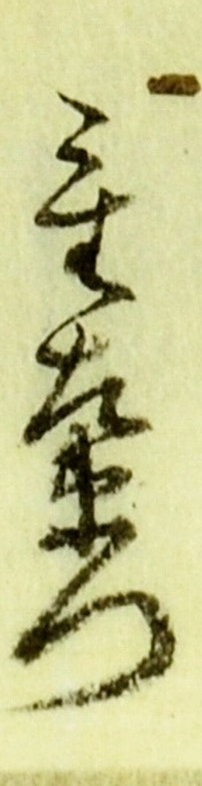重左衛門
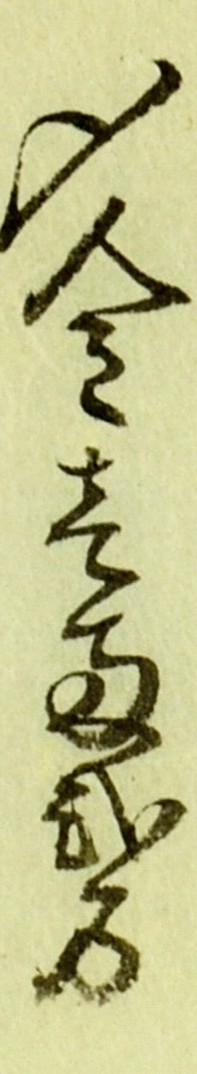〆金壱両弐分
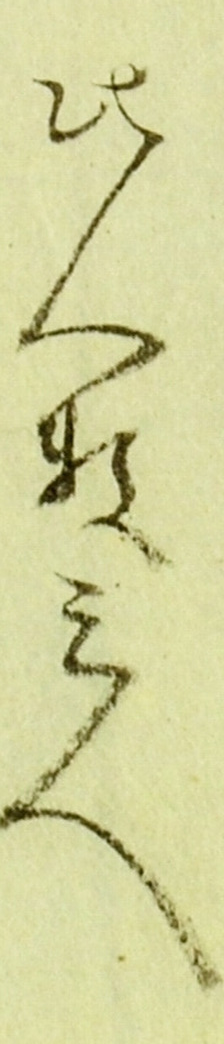此人数三人
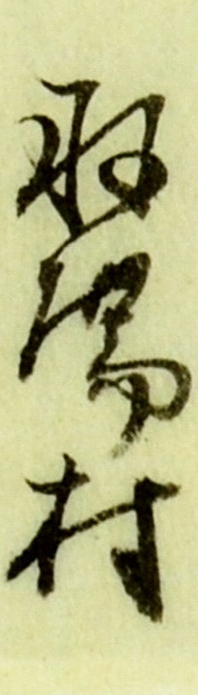羽場村

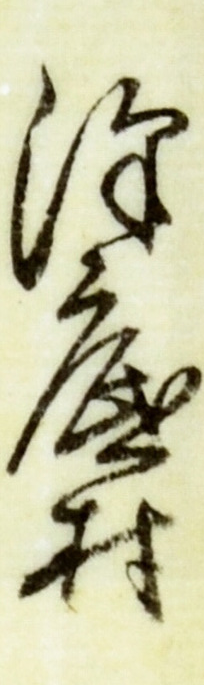沢底村
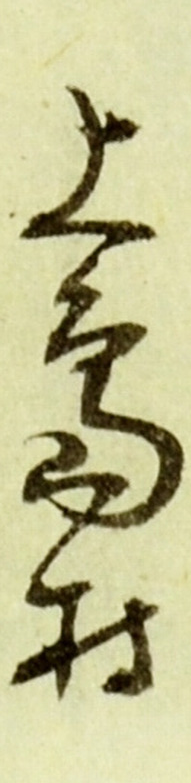上島村
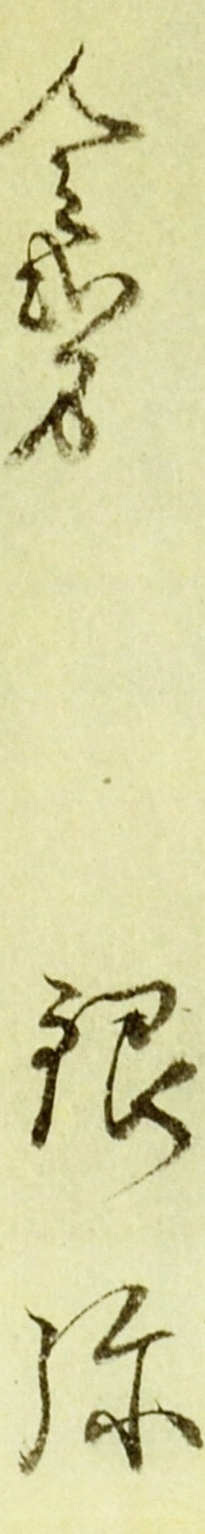金弐分銀弥
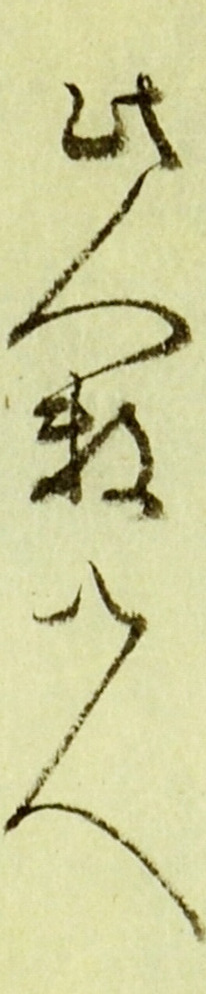此人数八人

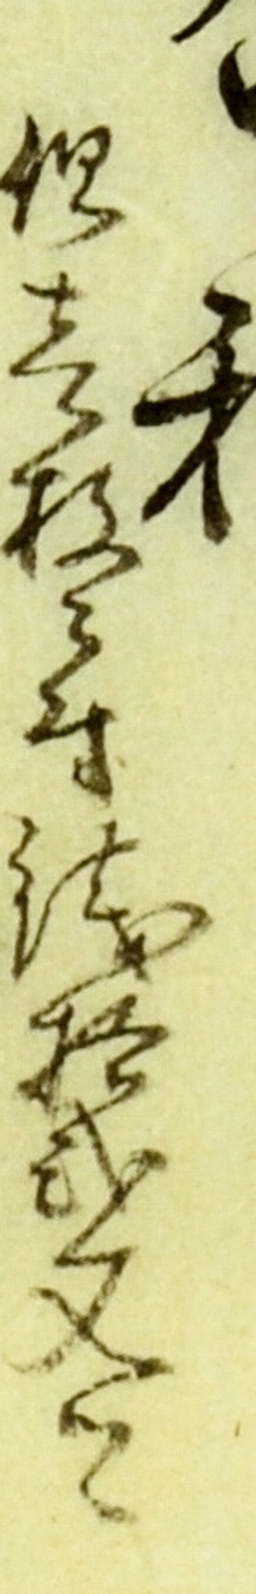但壱枚ニ付銭拾弐文ツゝ
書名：上伊那郷諸運上取調帳
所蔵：伊那市立高遠町図書館・合同会社AMANE
